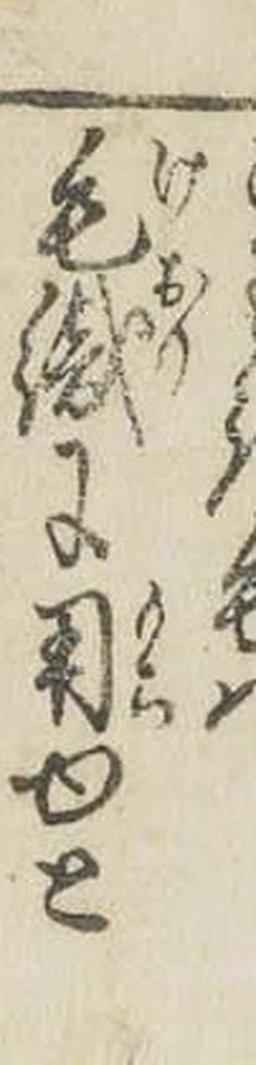毛織に用ゆと
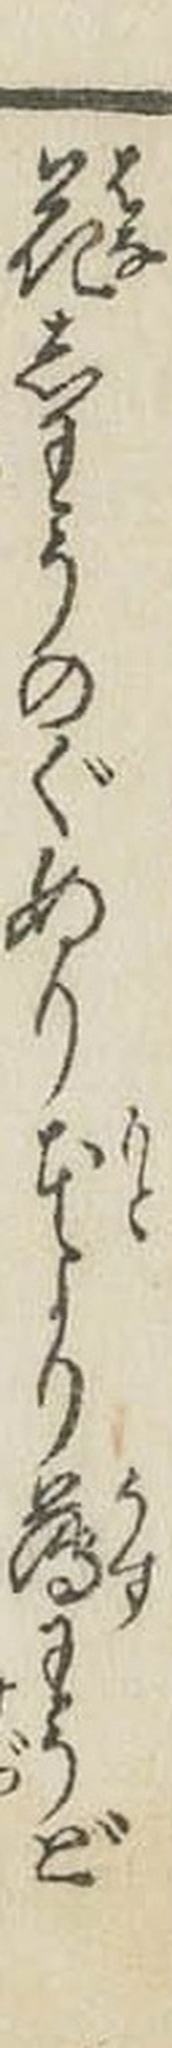花しわうのぐぬり本より薄わうど
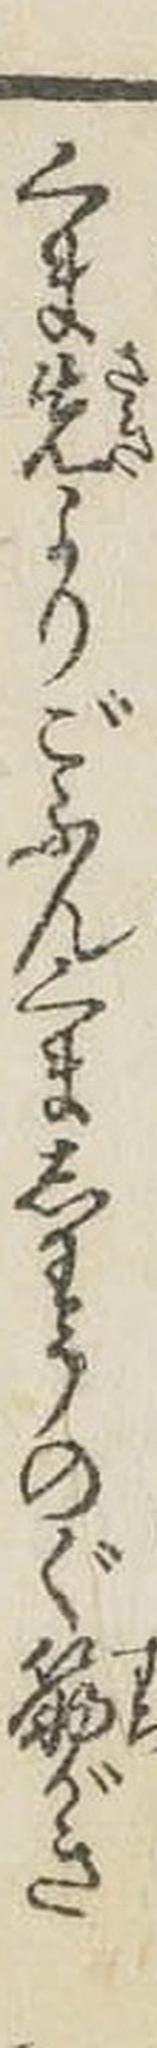くま先よりごふんくましわうのぐ筋がき
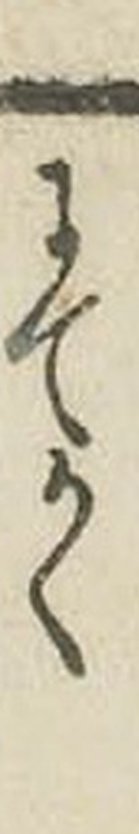にてかく
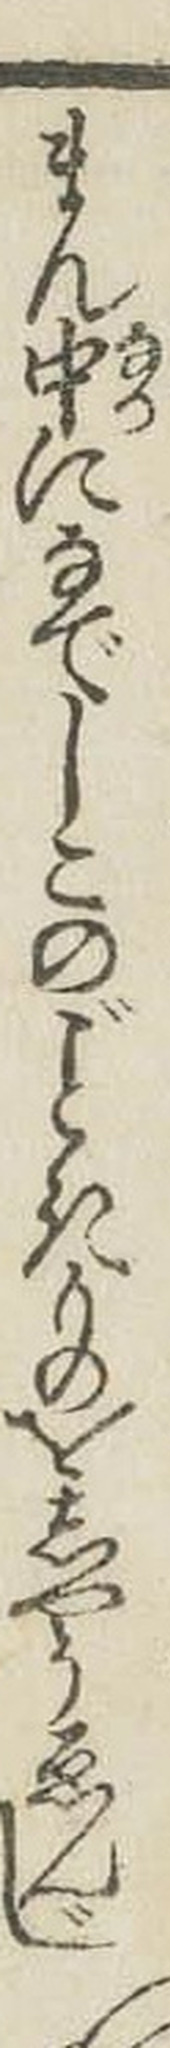まん中になでしこのごときものをしやうゑんじ
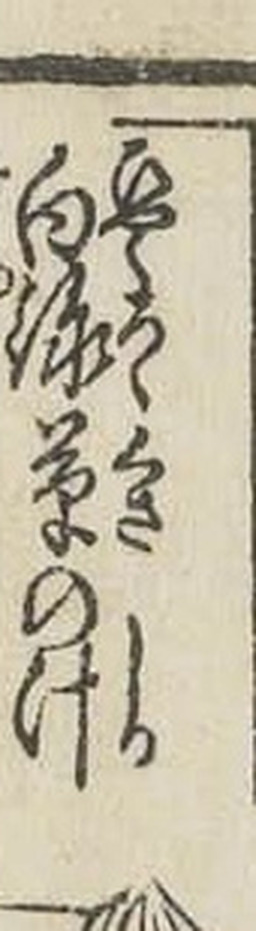白緑草の汁
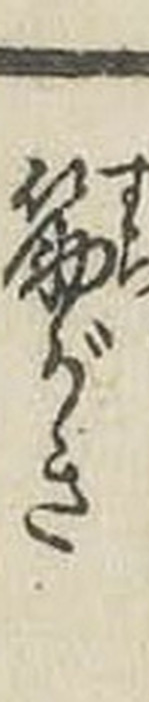筋がき
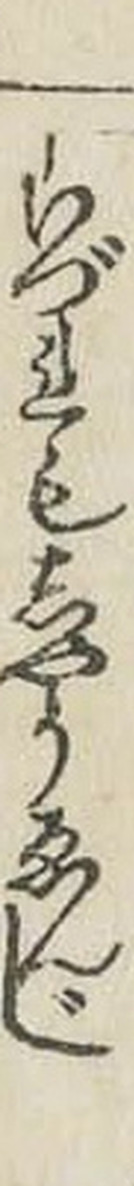いづれもしやうゑんじ
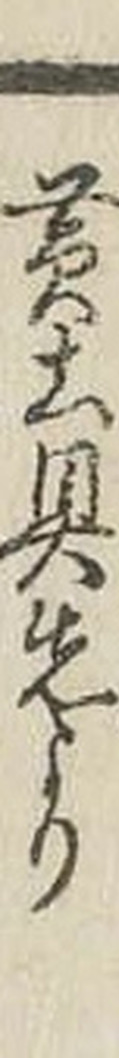黄土具先より
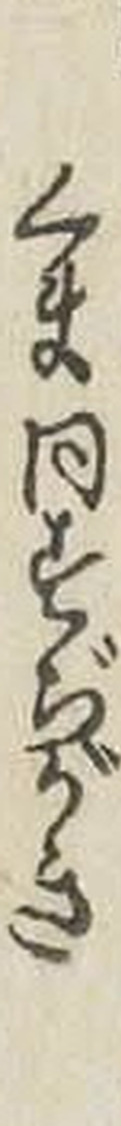くま同すぢがき
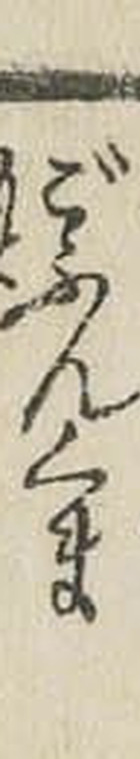ごふんくま
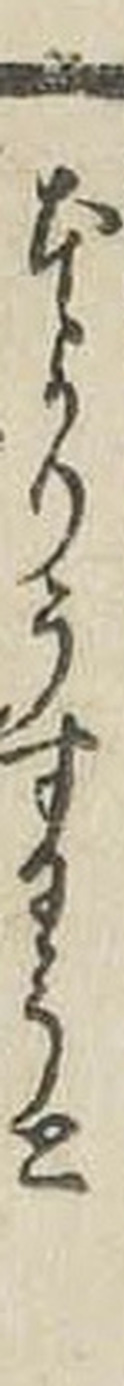本よりうすわうと
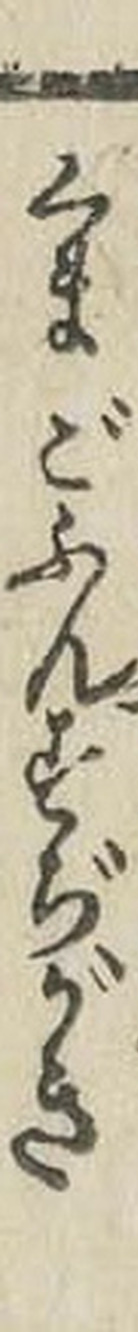くまごふんすぢがき

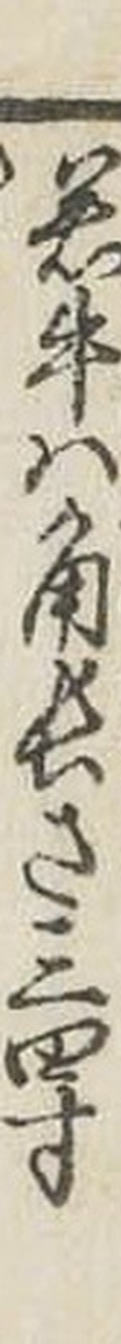若牛は角長さ三四寸
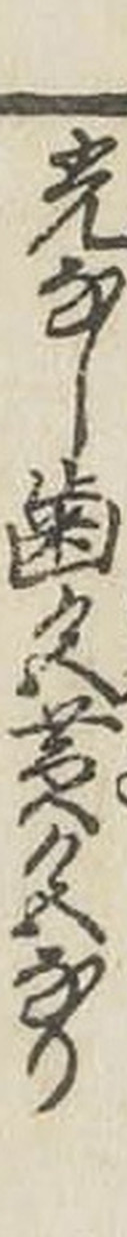光なし歯色黄色なり
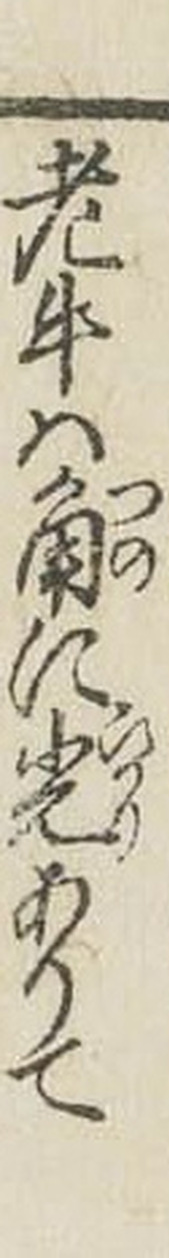老牛は角に光ありて
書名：絵本写宝袋 9巻 9之巻下
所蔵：東京学芸大学教育コンテンツアーカイブ
